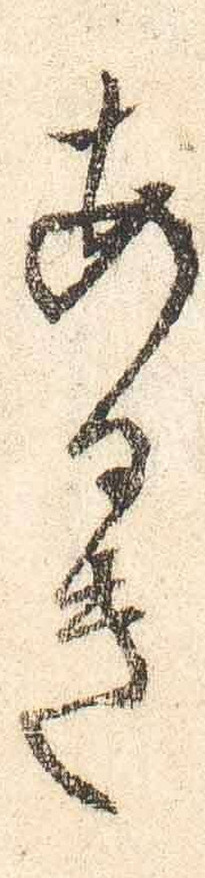あるき
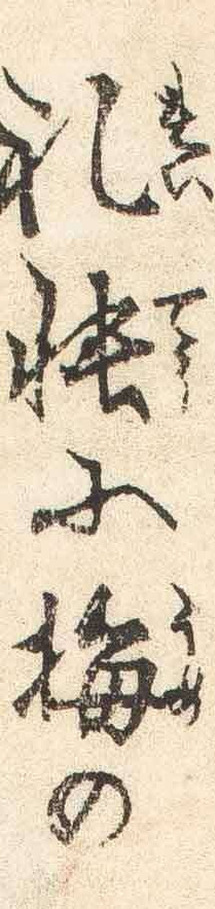礼帳に梅の
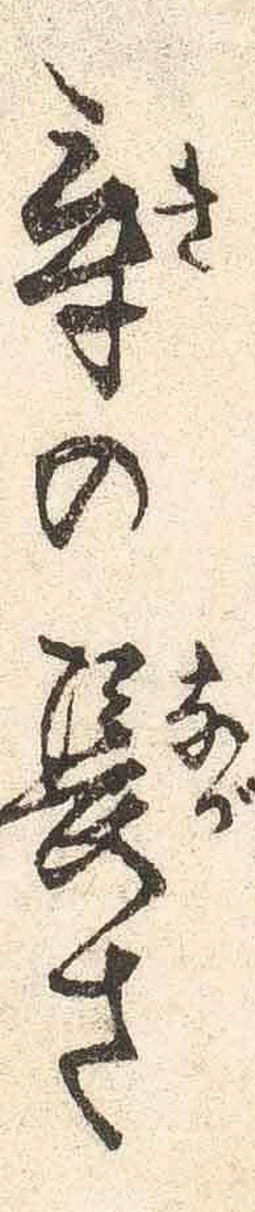気の長さ
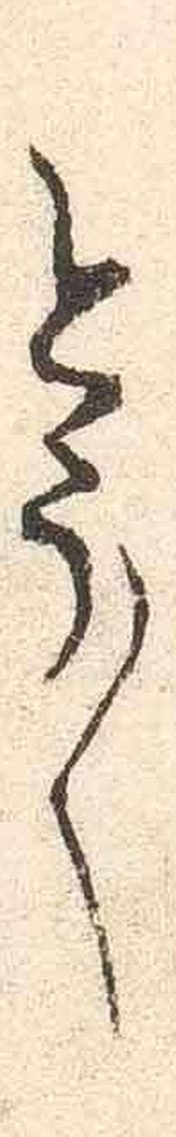とう〳〵
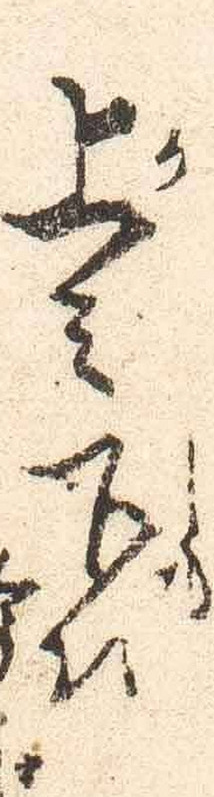上み下は
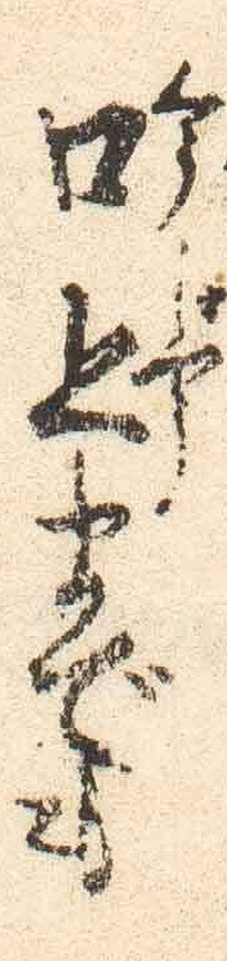口上までも
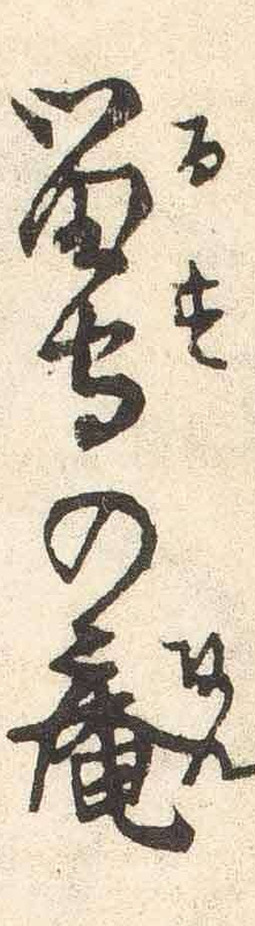留守の庵

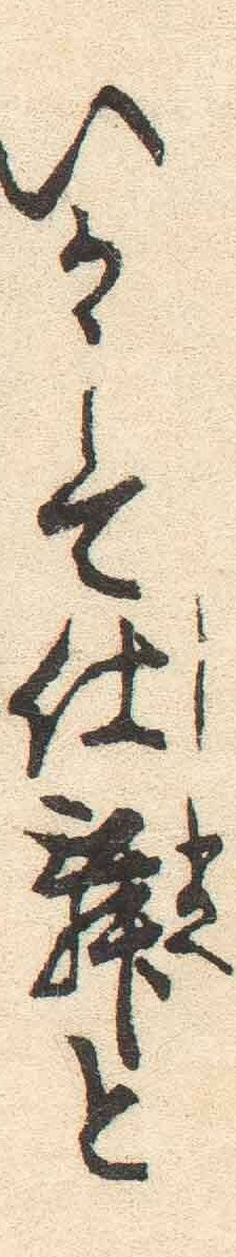いかして仕舞と
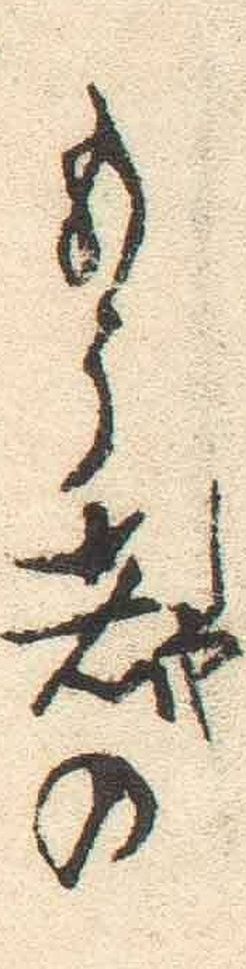もう者の
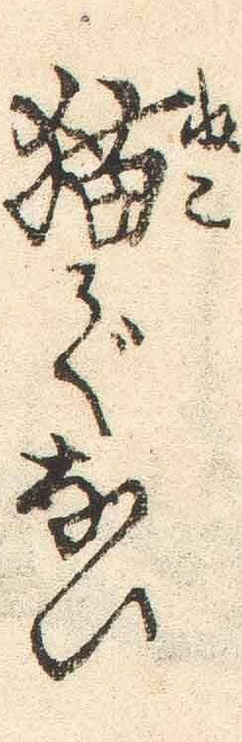猫でない
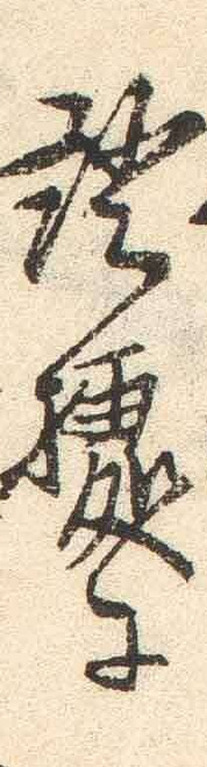証拠に
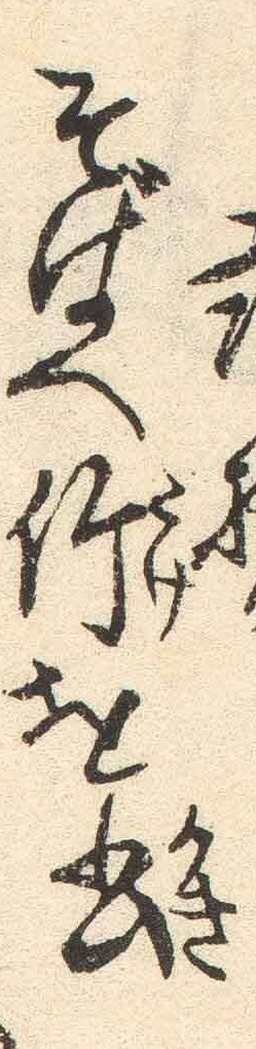そばへ竹を書
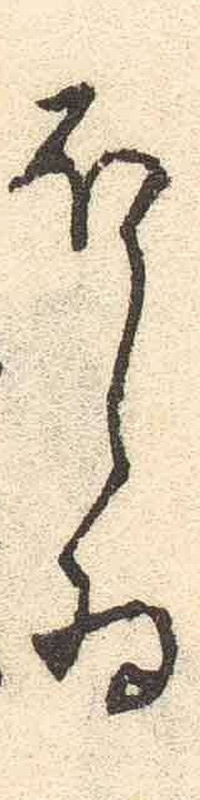ほしゐ
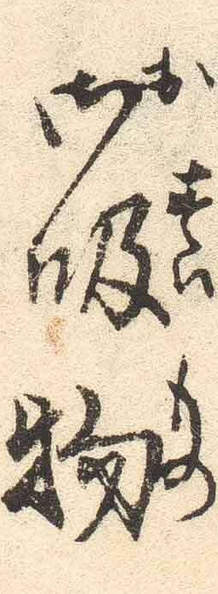御吸物
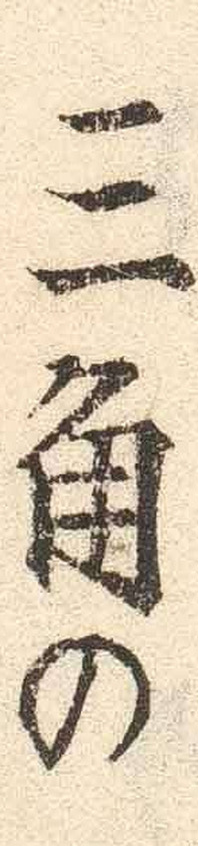三角の
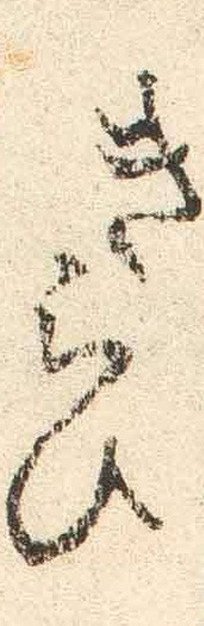きらひ
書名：画本柳樽
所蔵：東京学芸大学附属図書館 国文学研究資料館
